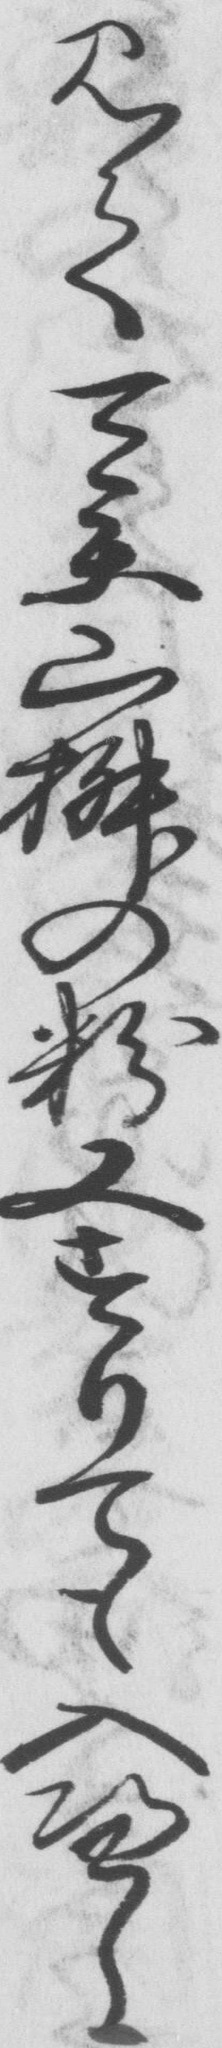みて可参山椒の粉又すりても入へし
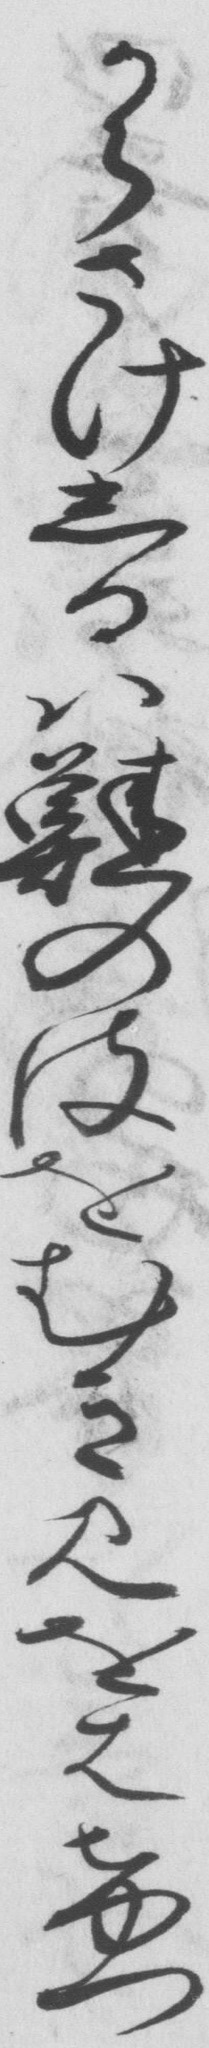一○からさけしるは鮭の皮をむきみをはけつ
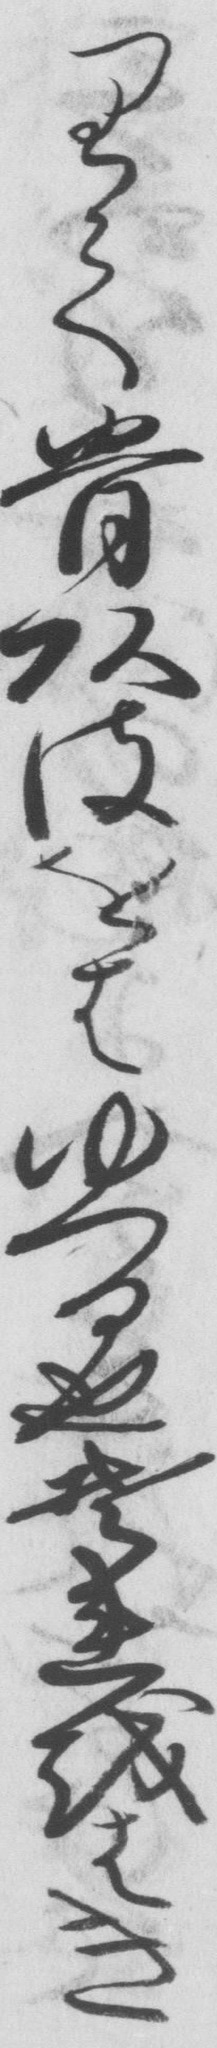りて骨頭皮をはゆつる也それをはき
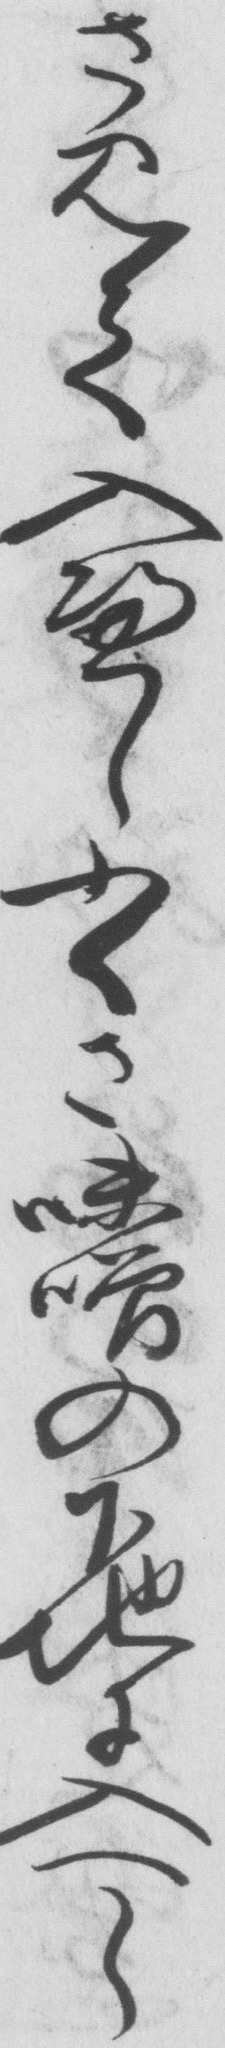さみて入へしふき味噌の下地に入へし
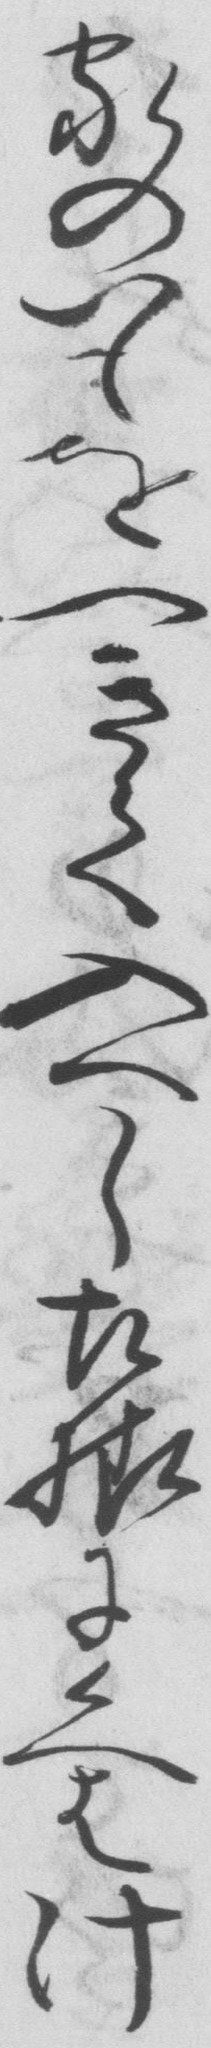家のいもをへきて入へし左様に候へは汁
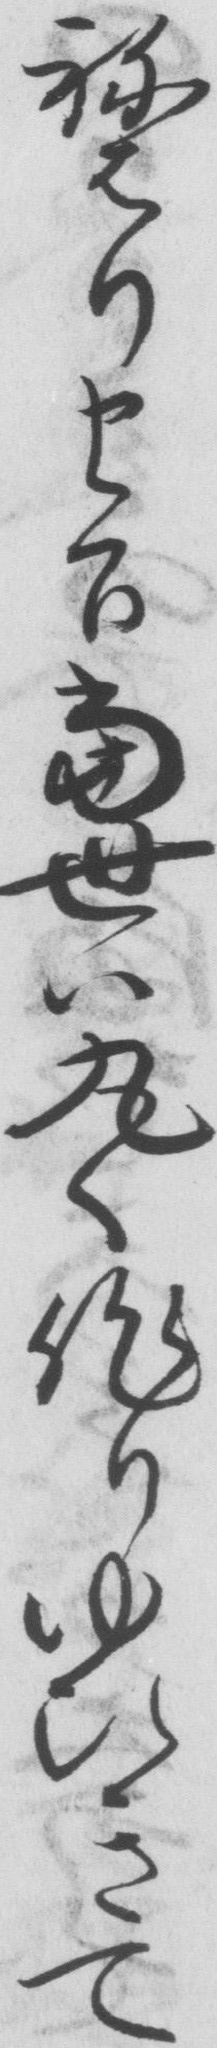ねはり申候間当世は丸く作りゆひきて
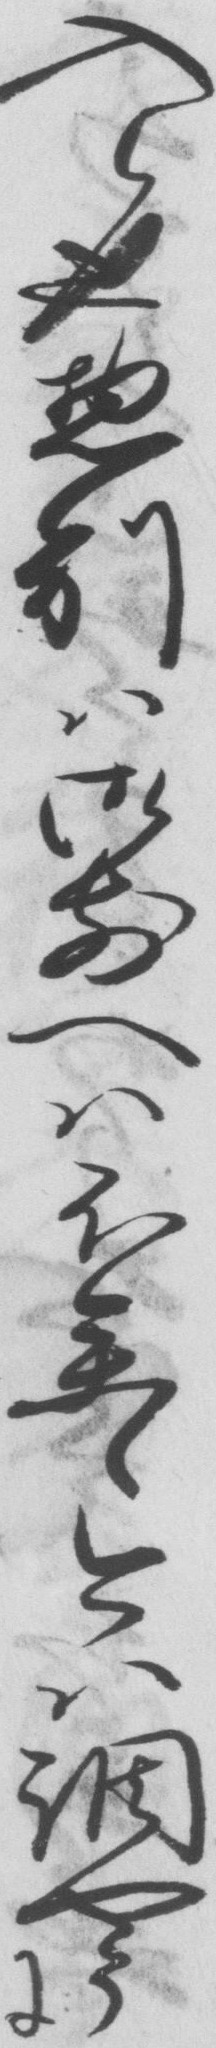入候也惣別は御前へは不参候今は調やうに

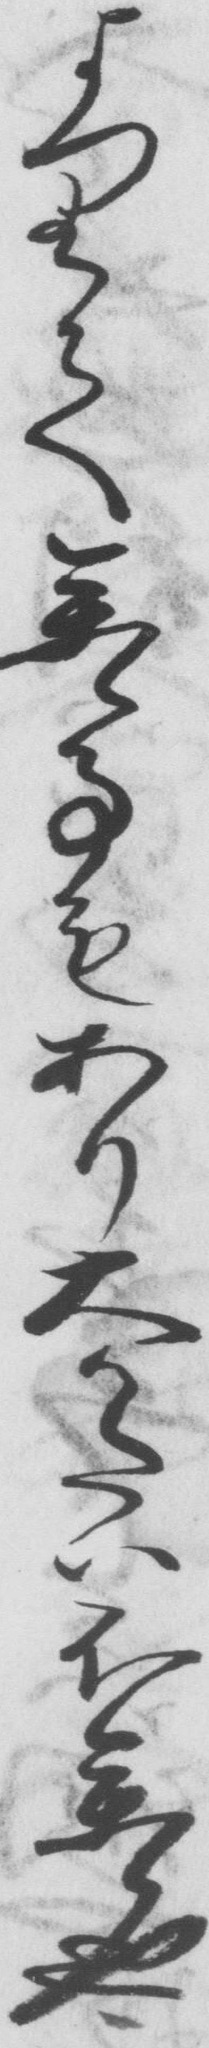よりて参候事もあり大かたは不参候也
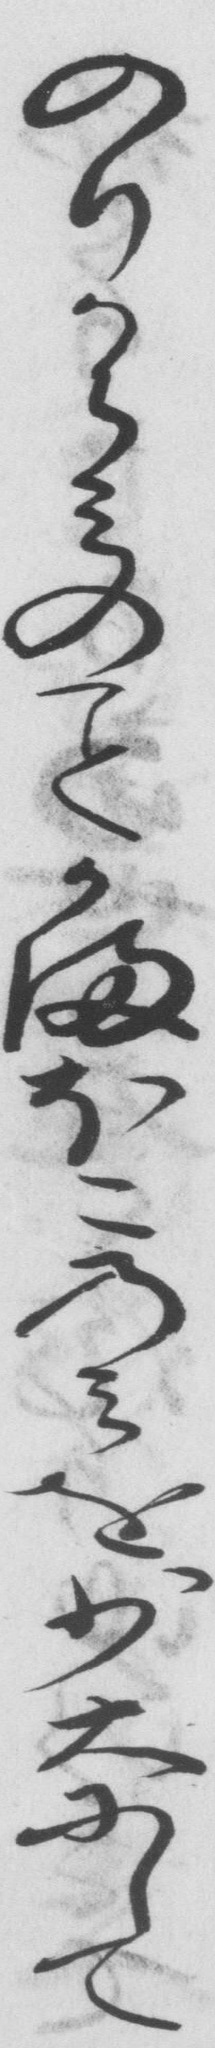一○のりからみのことかまほこのみを少大にして
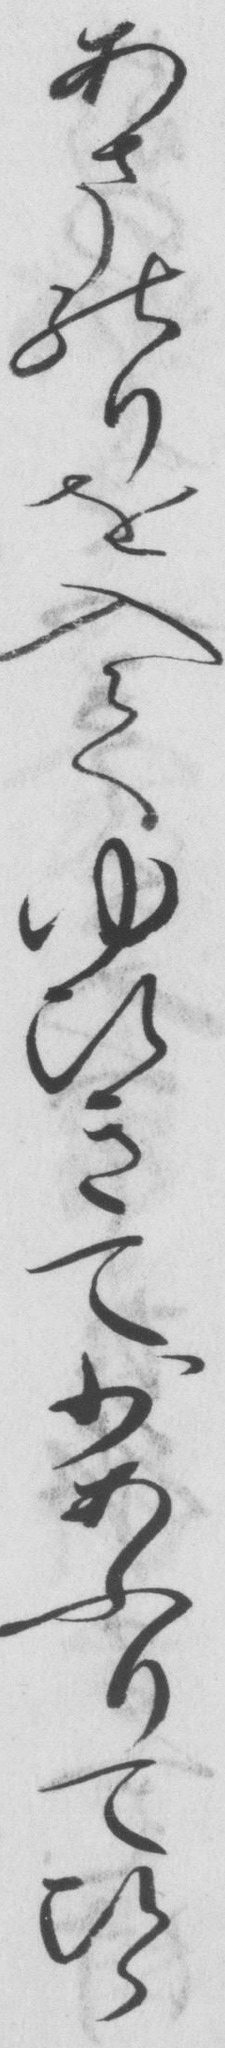あさのりを入てゆひきて少あふりてひら
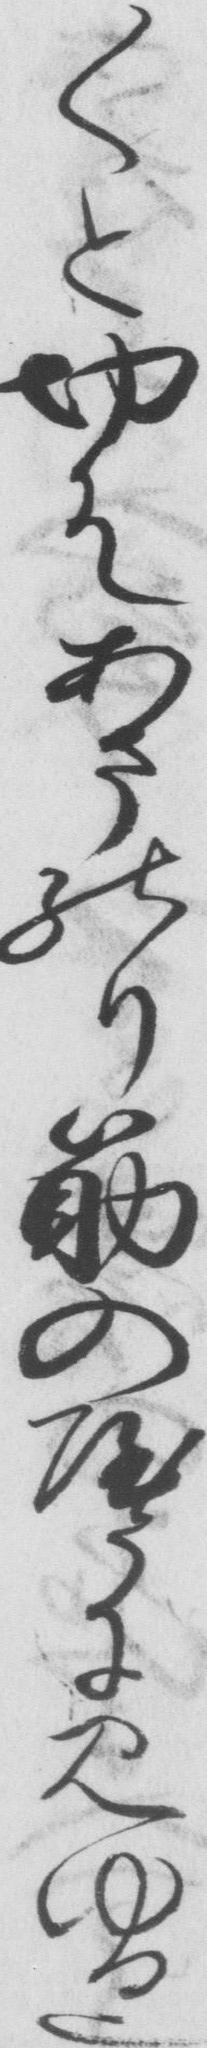〳〵と切てあさのり筋のやうに見ゆる也
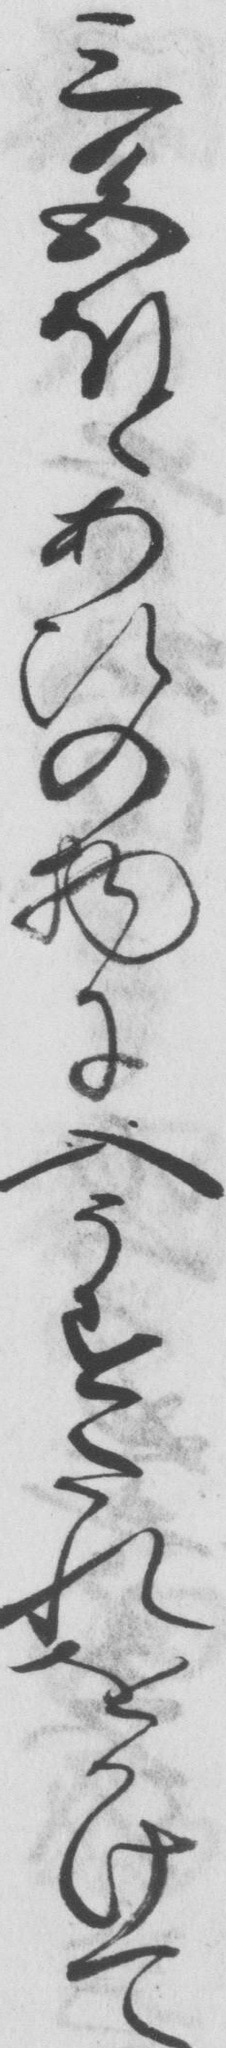三色ほとあひの物に入うすたれをかけて
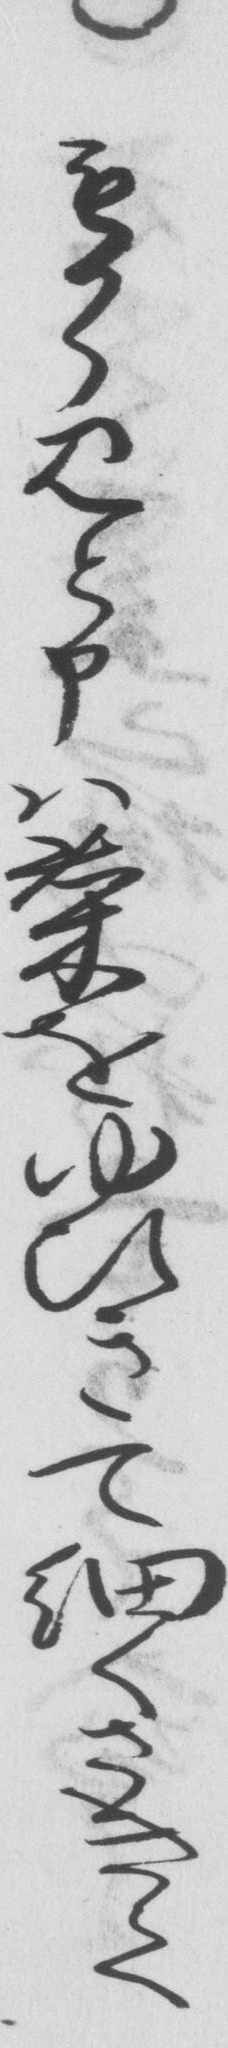一○もからみと申は菜をゆひきて細くさきて
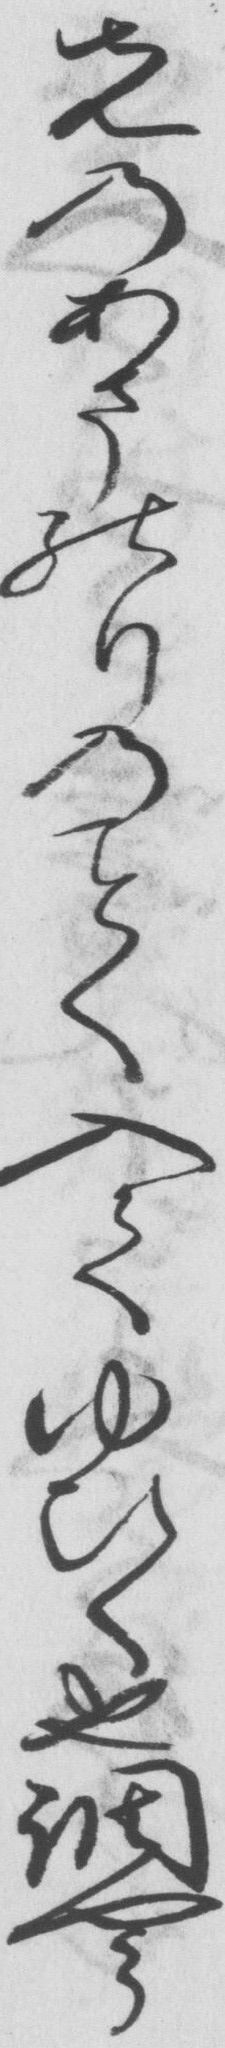先のあさのりのことく入てゆひく也調やう
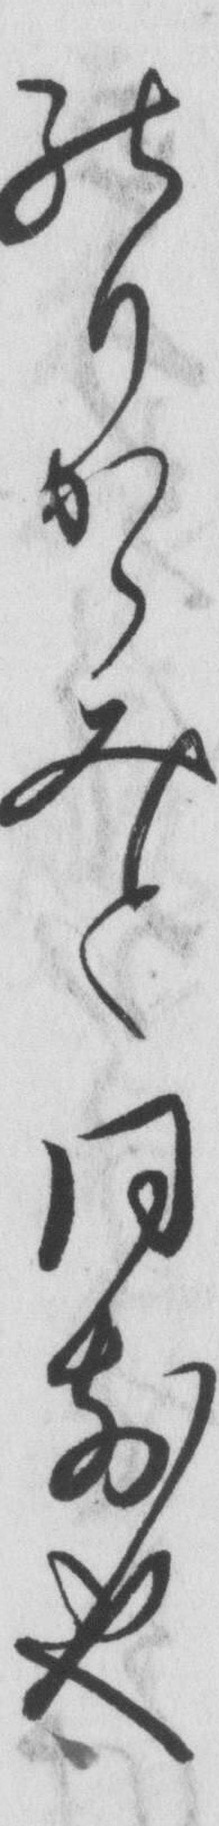のりからみと同前也
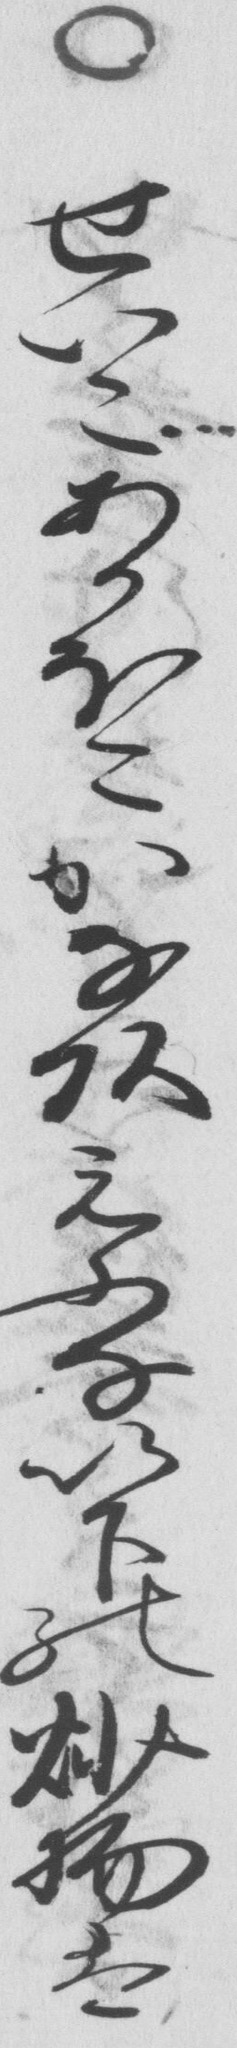一○せいごあかほこかな頭えふな以下の炒物は
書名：料理次第
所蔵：大阪府立大学学術情報センター 国文学研究資料館
